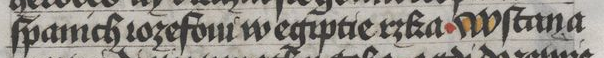ſpanich iozefoui w egiptie rzka.Wſtan a
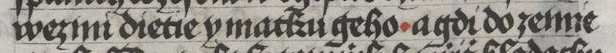wezmi dietie y matku geho.a gdi do zemie
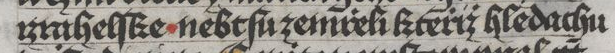izrahelſke.nebt ſu zemṙeli kteṙíż hledachu
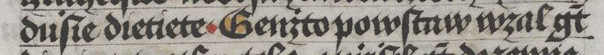duẛie dietiete.Genżto powſtaw wzal ḡt
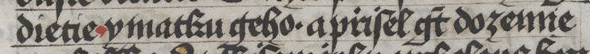dietie.y matku geho.a pṙiẛel ḡt do zemie
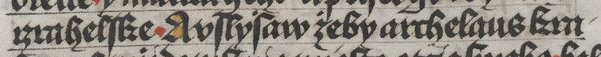izrahelſke.A uſlyẛaw żeby archelaus kra¬
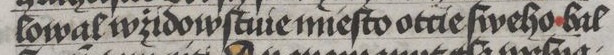lowal wżidowſtuie míeſto otcie ſweho.bal
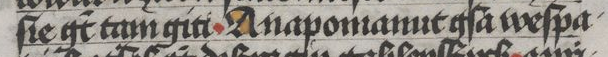ſie ḡt tam giti.A napomanut gſa weſpa¬
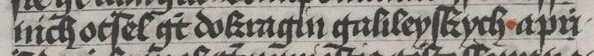ních otẛel ḡt dokragin galileyſkych.a pṙi¬
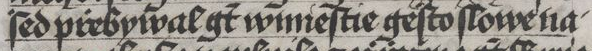ẛed pṙebywal ḡt vmieſtie geẛto ſlowe na¬
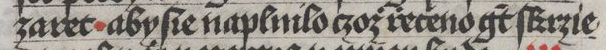zaret.aby ſie naplnilo czoż ṙeċeno ḡt ſkrzie
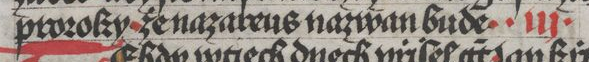proroky.że nazareus nazwan bude..iij.
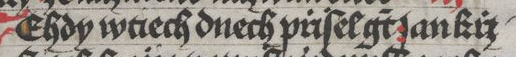Ehdy w tiech dnech pṙiẛel ḡt Jan kṙz¬
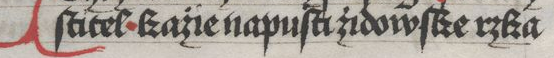ſtitel. każie napuẛti żidowſke rzka¬
